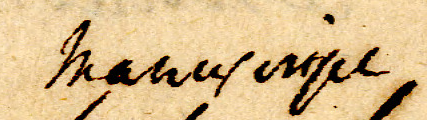manuscript
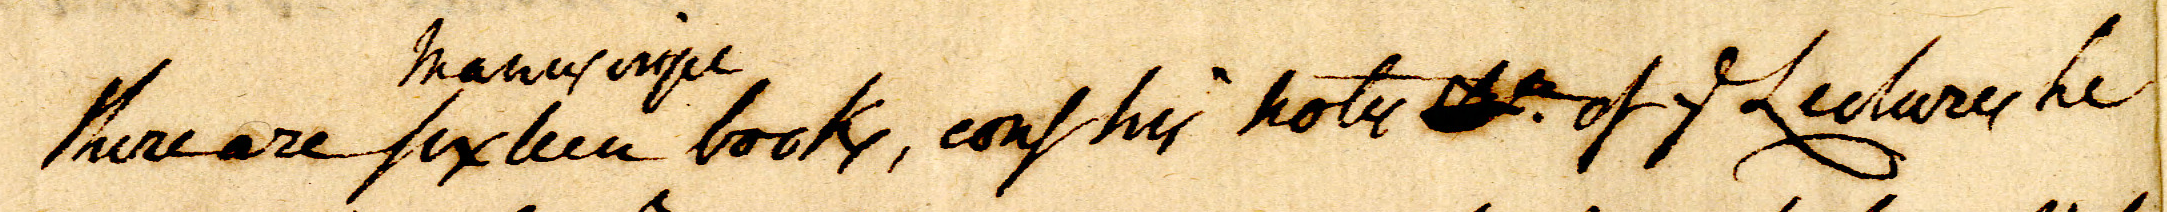there are sixteen ^ books, cont his notes [&c^a.] of y^e Lectures he
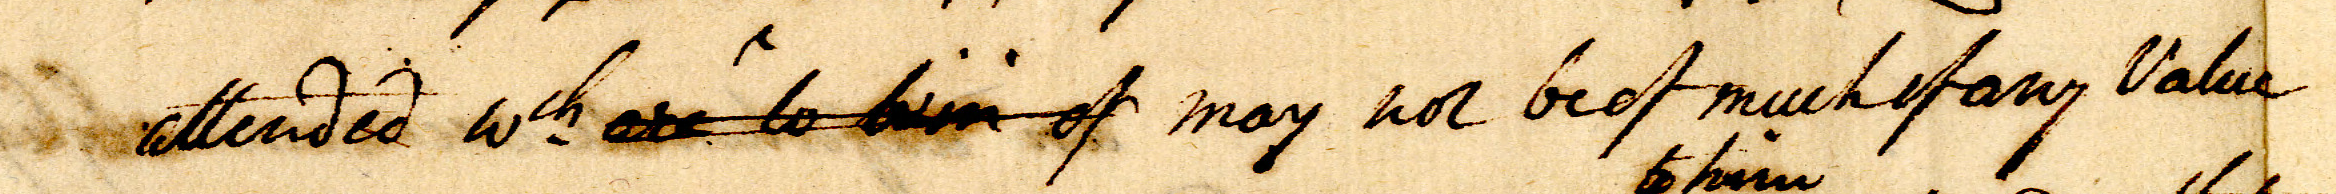attended w^ch. [are to him of] may not be of much of any Value
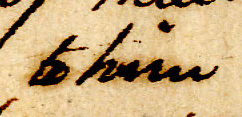to him
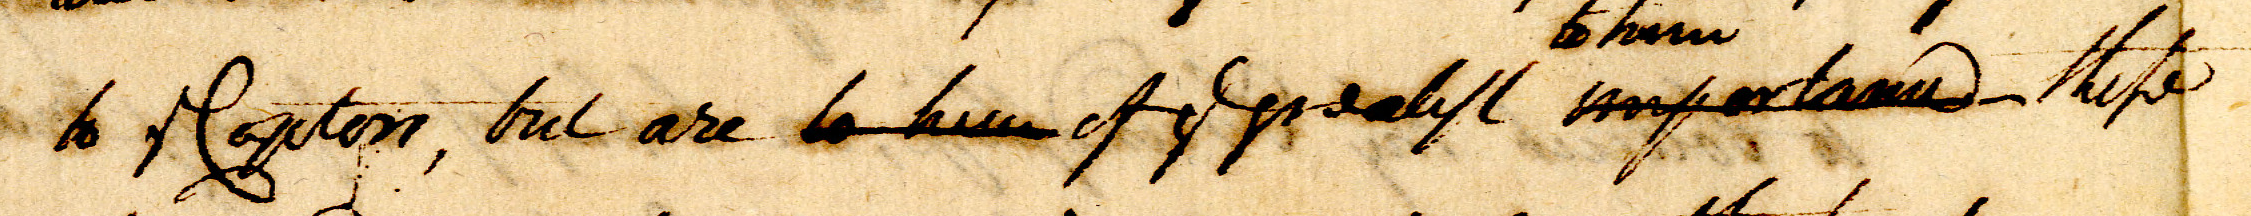to y^e Captor, but are [to him] of y^e greatest [importance] these
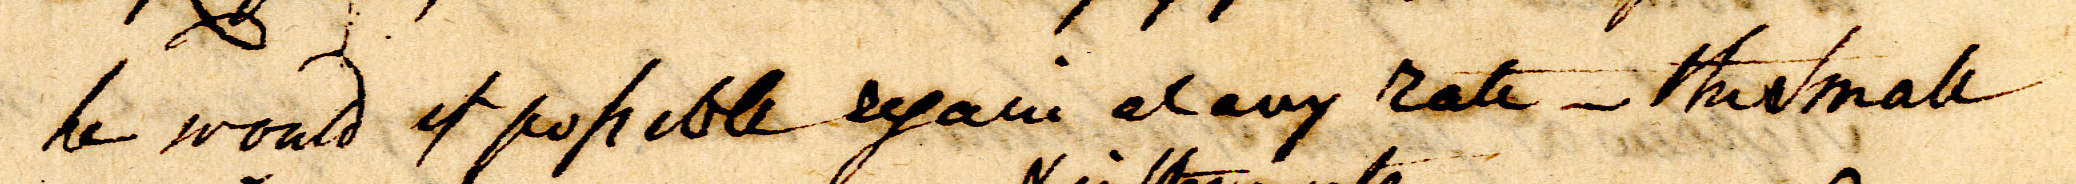he would if possible regain at any rate- the Small
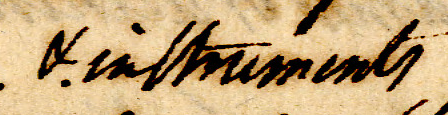& instruments
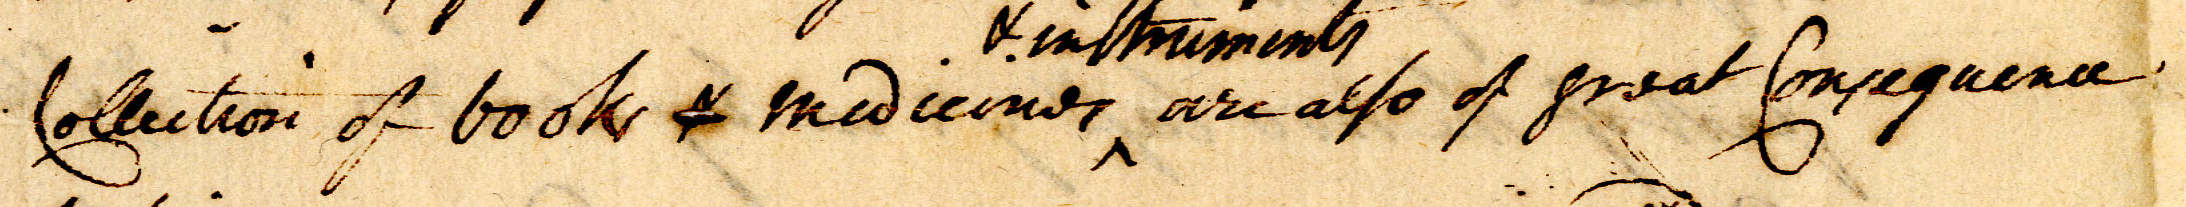Collection of books & medicines ^ are also of great Consequence
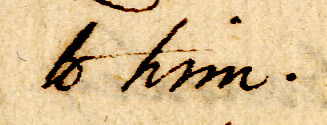to him.
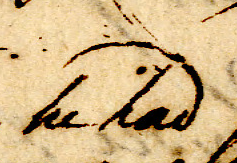he had
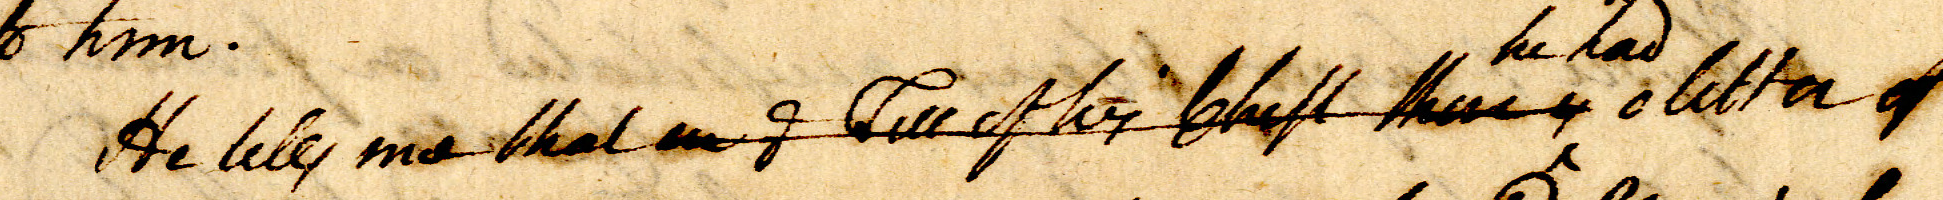He tells me that [in y^e Till of his Chest these] a letter of
